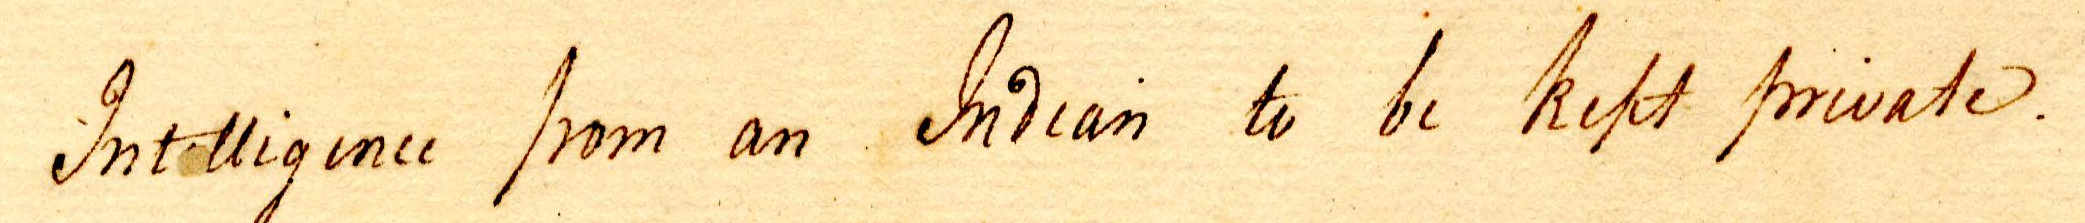Intelligence from an Indian to be kept private.
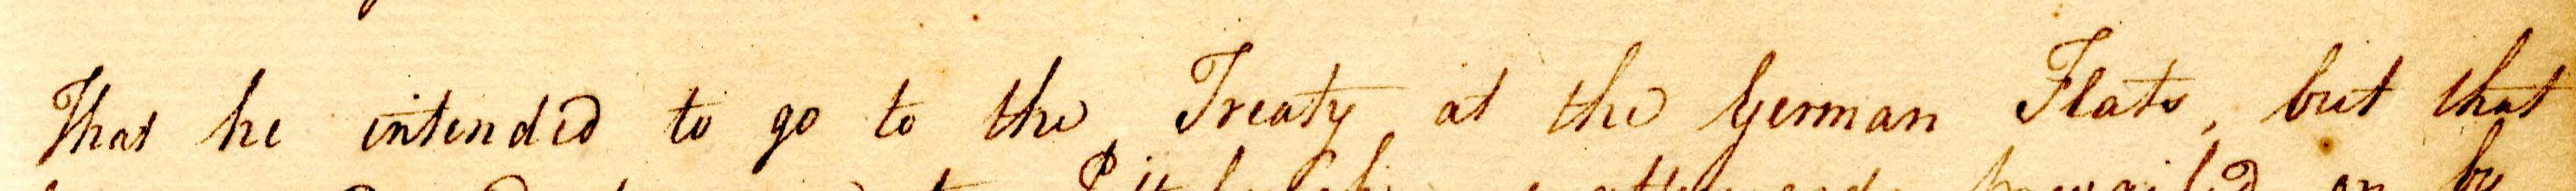That he intended to go to the Treaty at the German Flats, but that
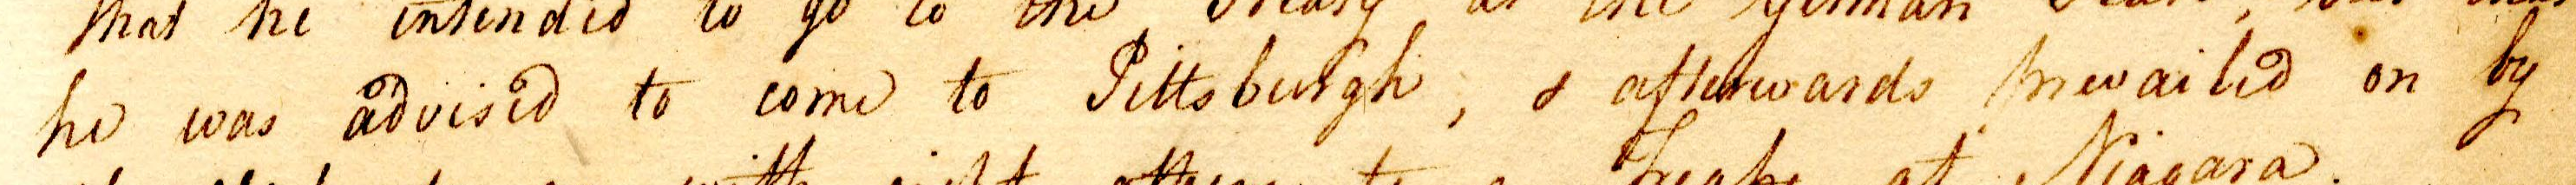he was advised to come to Pittsburgh, & afterwards prevailed on by
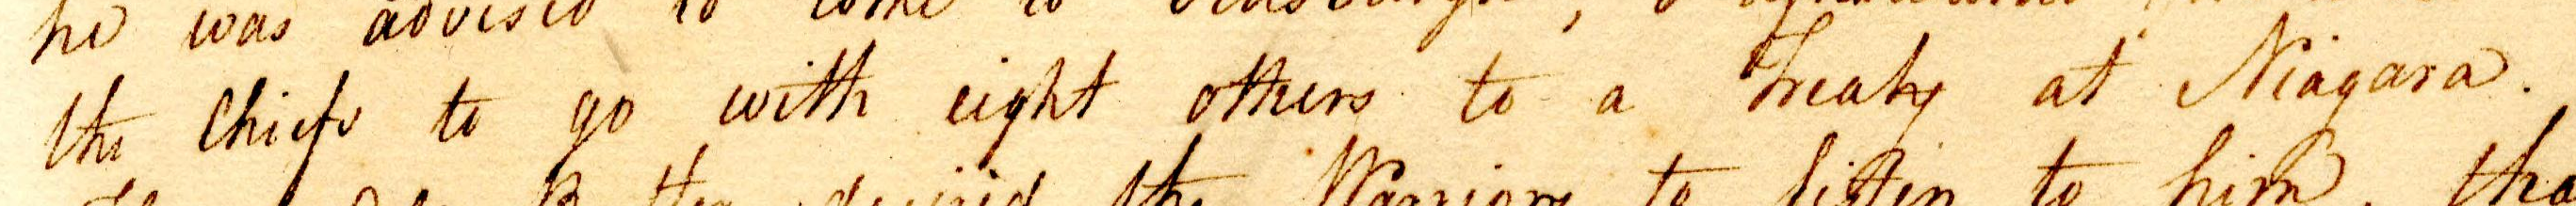the Chiefs to go with eight others to a Treaty at Niagara.
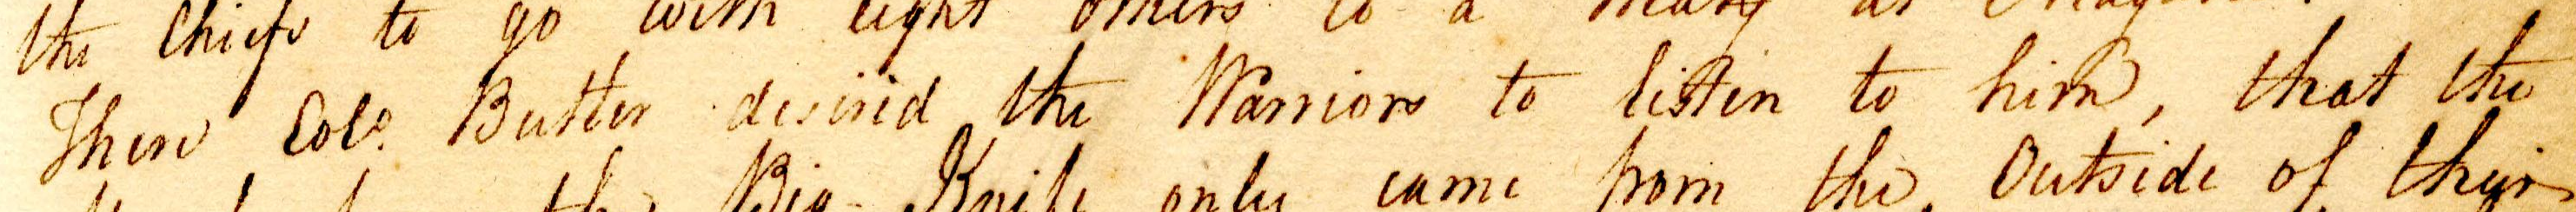There Col^o. Butler desired the Warriors to listen to him, that the
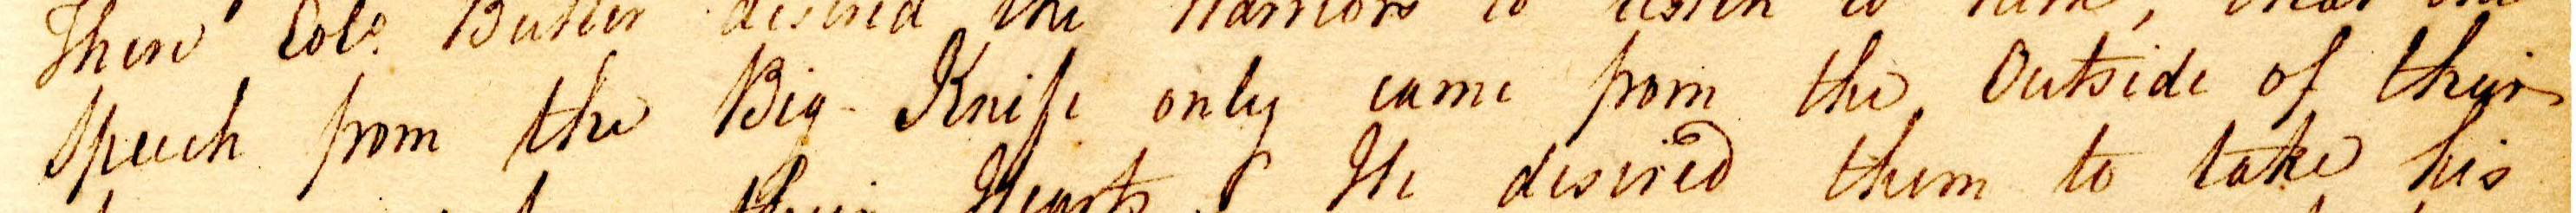Speech from the Big Knife only came from the Outside of their
